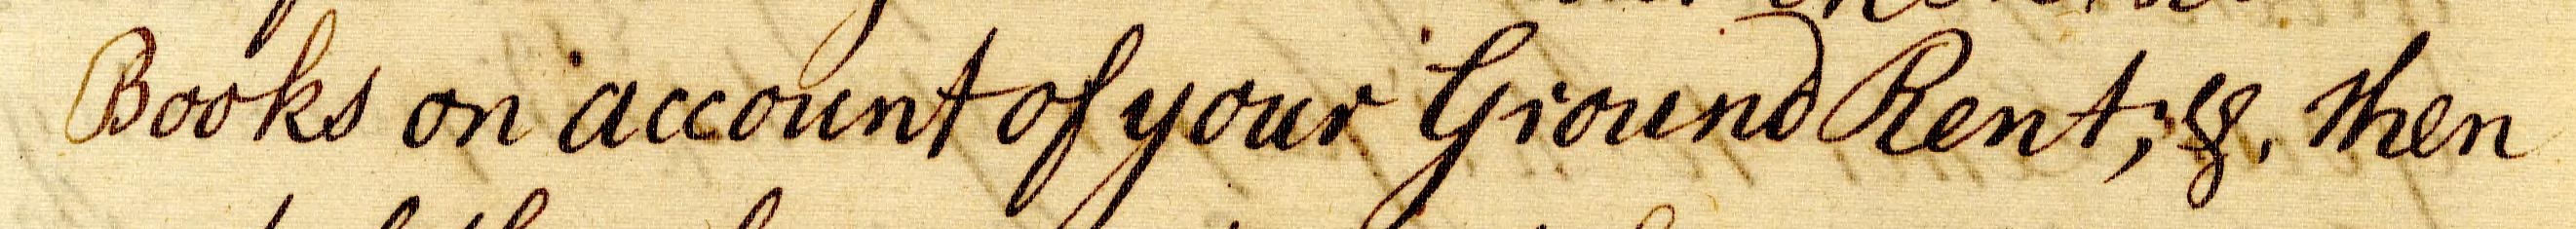Books on account of your Ground Rent, &, then
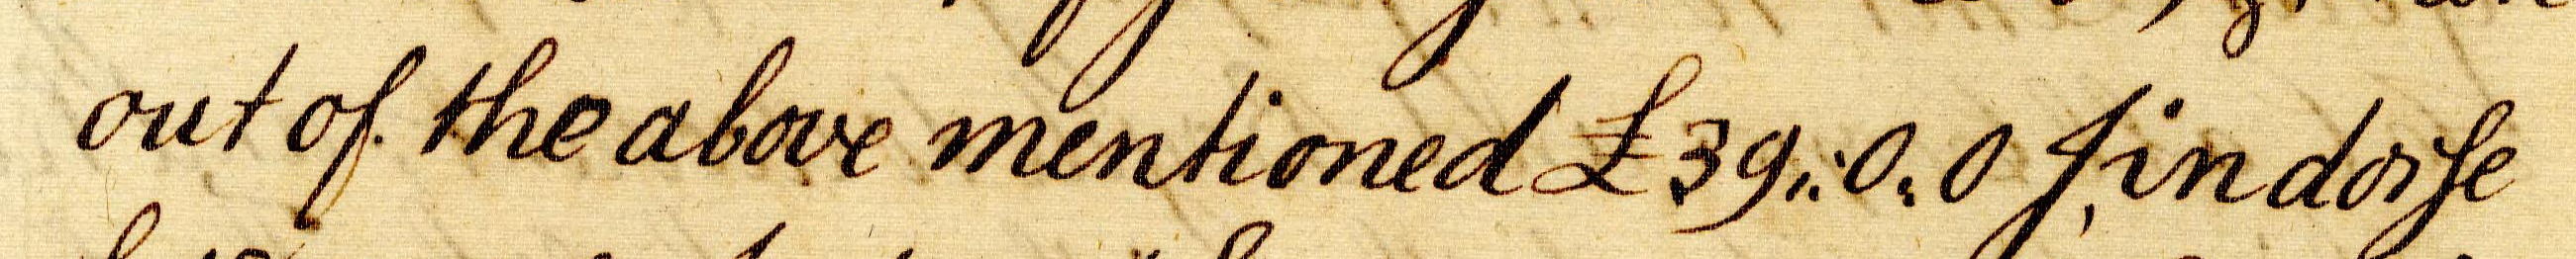out of the above mentioned £39..0..0 I, indorse
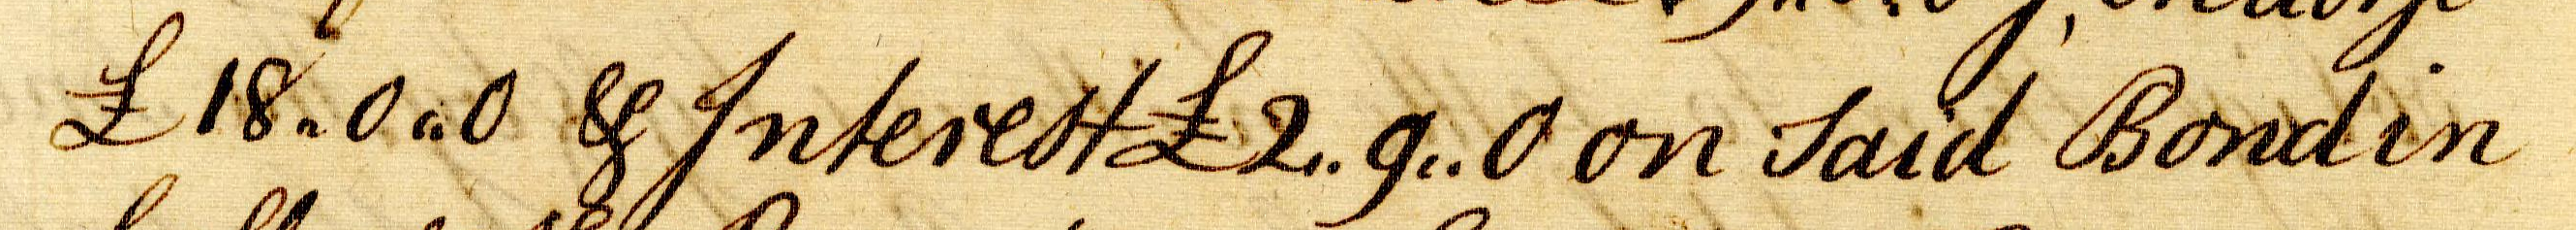£18..0..0 & Interest £2..9..0 on said Bond in
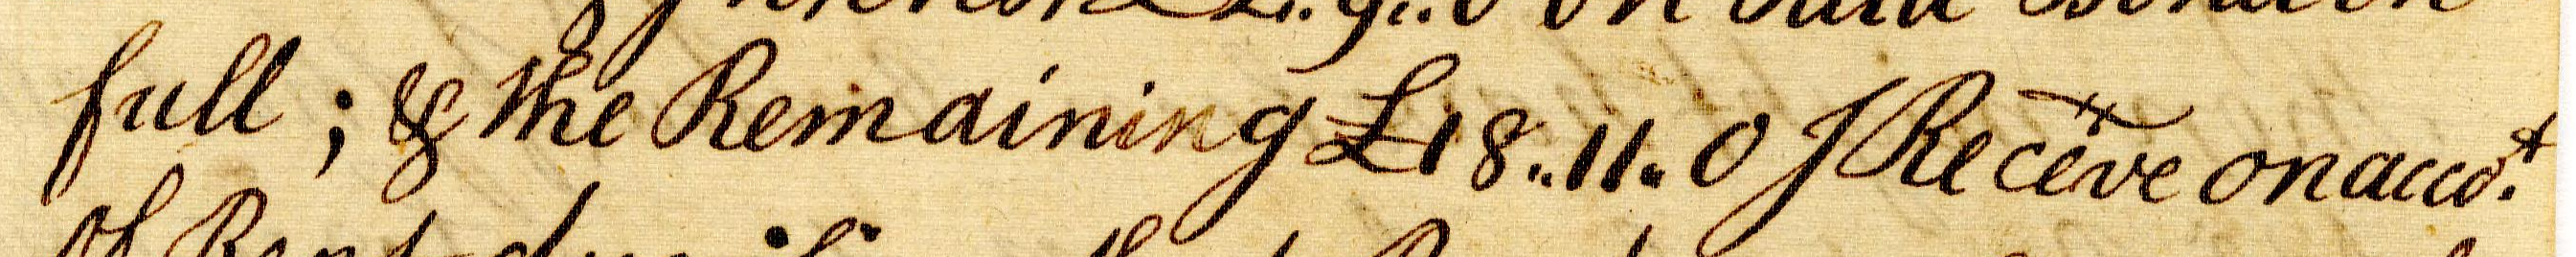full; & the Remaining £18..11..0 I Receve on acco^t.
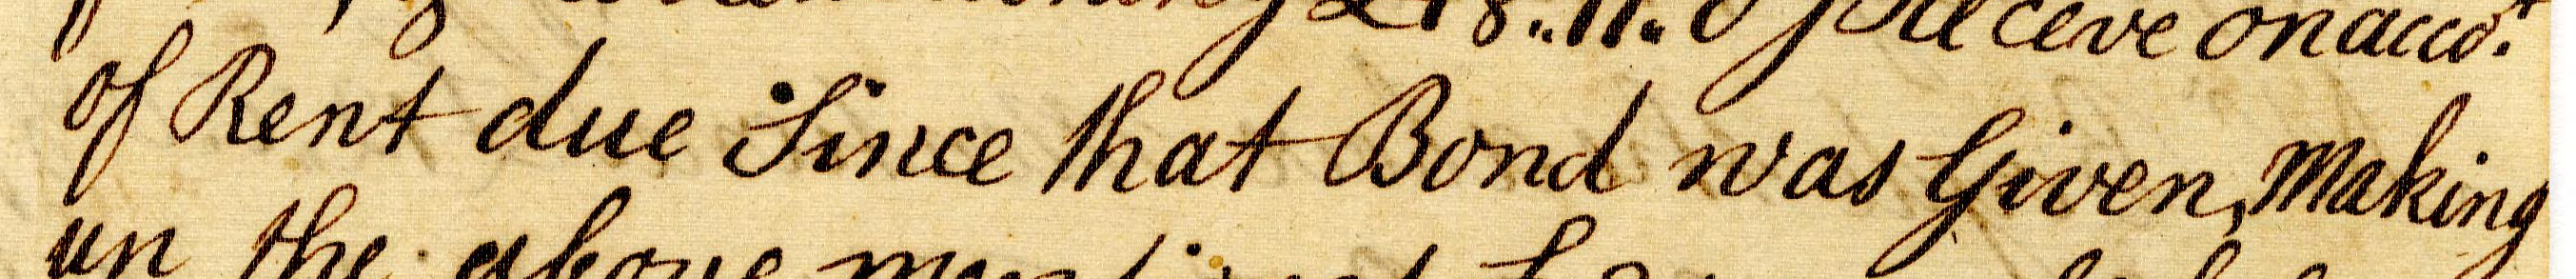of Rent due Since that Bond was Given, Making
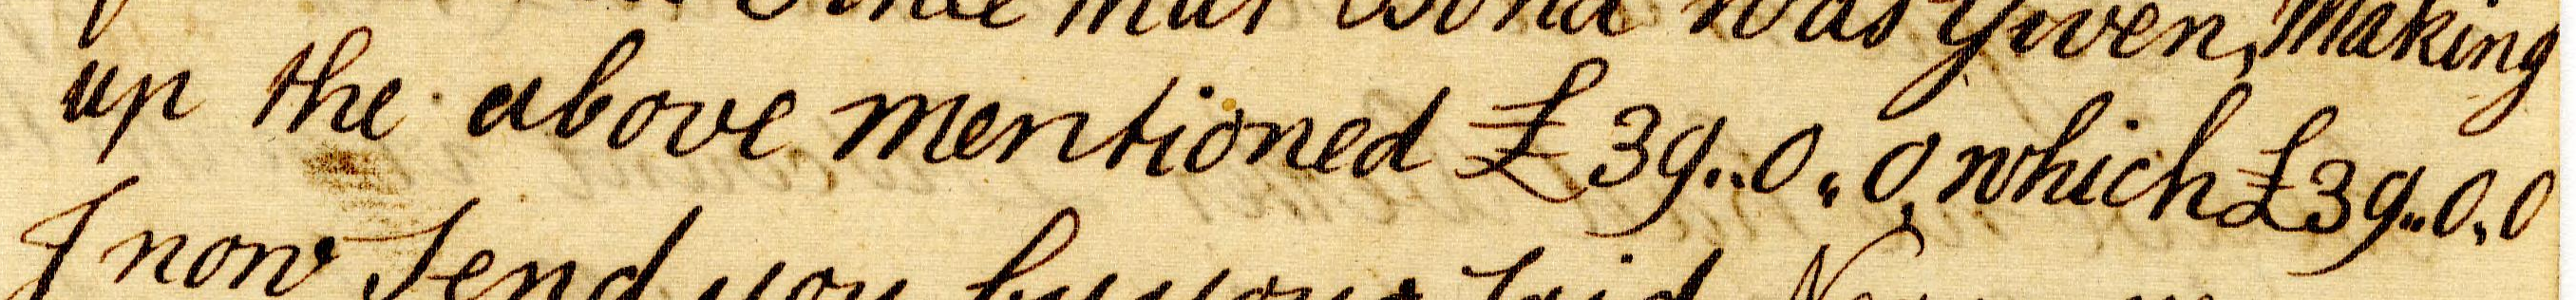up the above mentioned £39..0..0, which £39..0..0
